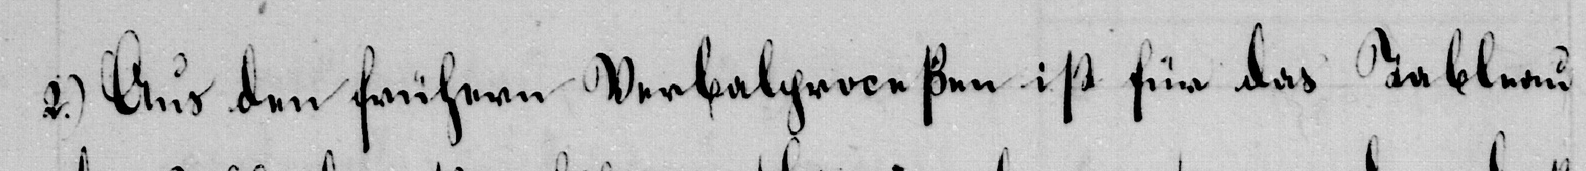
2.) Aus den frühern Verbalproceßen ist für das Tableau
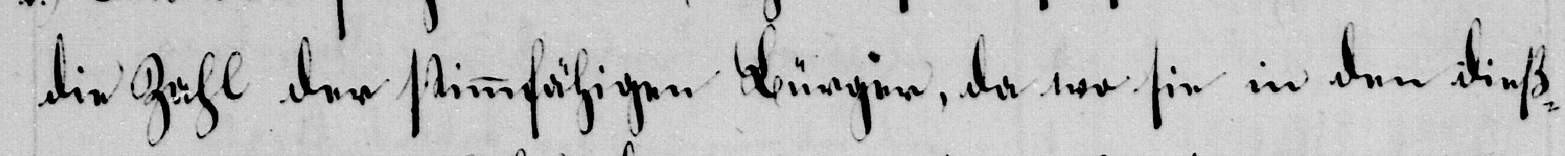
die Zahl der stimmfähigen Bürger, da wo sie in den dieß¬
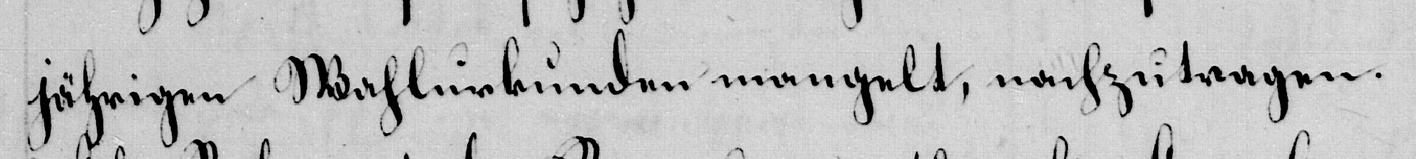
jährigen Wahlurkunden mangelt, nachzutragen.
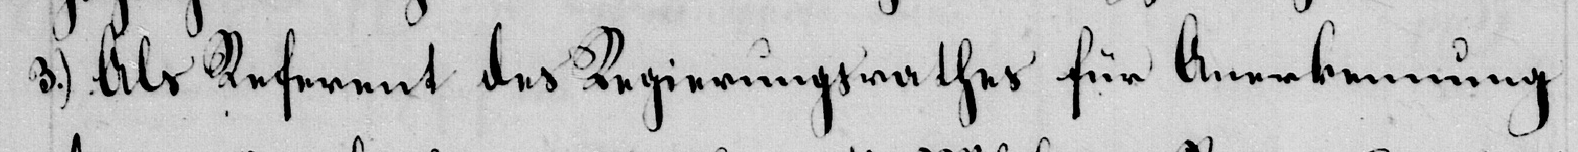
3.) Als Referent des Regierungsrathes für Anerkennung
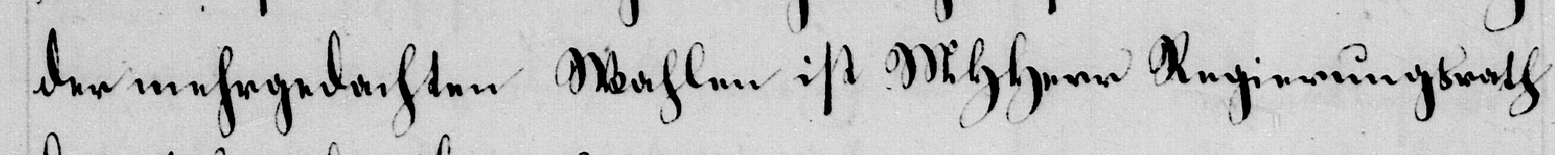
der mehrgedachten Wahlen ist MHHerr Regierungsrath
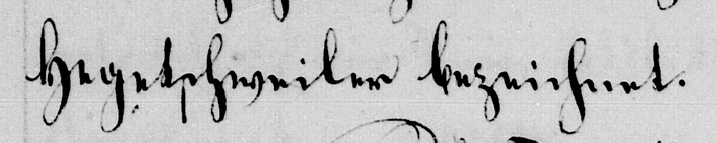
Hegetschweiler bezeichnet.
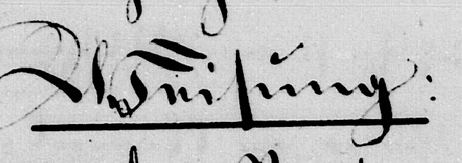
Weisung:
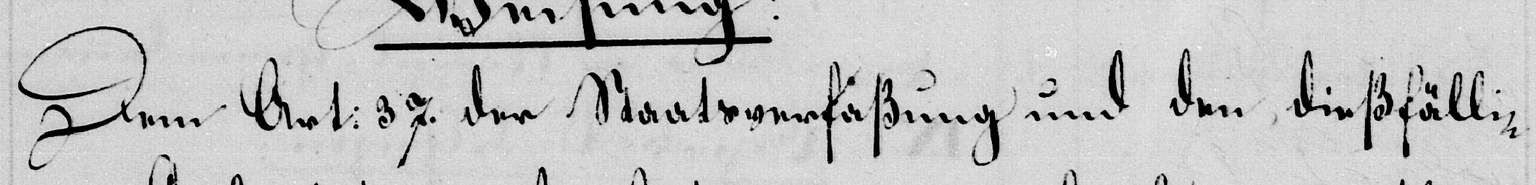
Dem Art: 37. der Staatsverfassung und den dießfälli¬
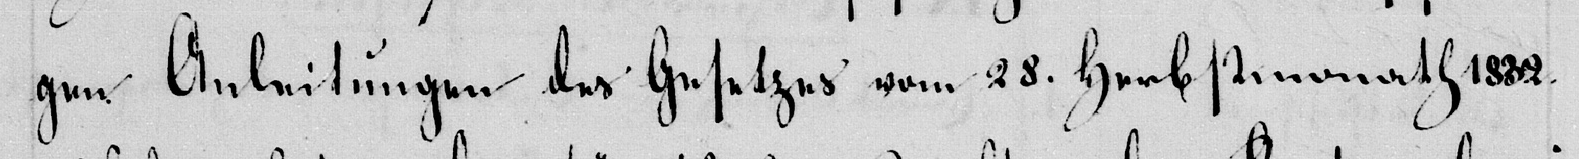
gen Anleitungen des Gesetzes vom 28. Herbstmonath 1832.
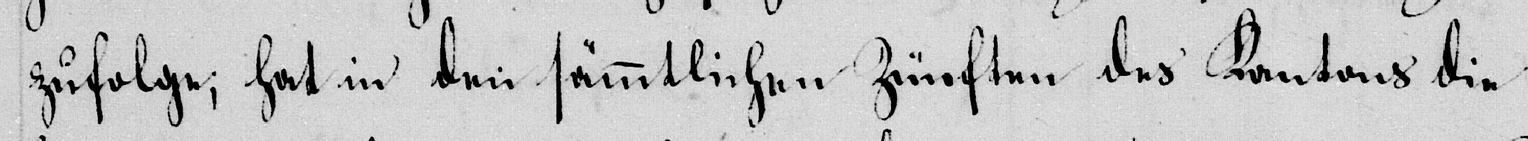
zufolge, hat in den sämmtlichen Zünften des Kantons die
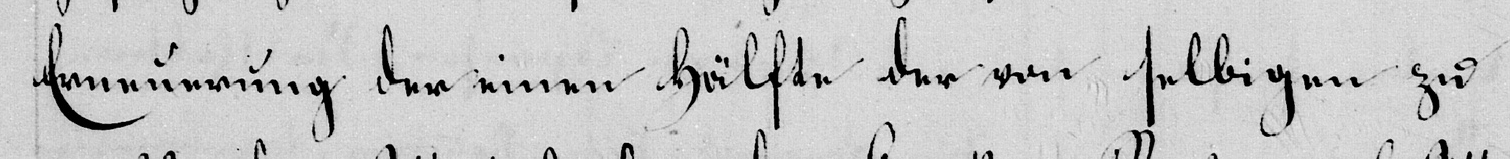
Erneuerung der einen Hälfte der von selbigen zu
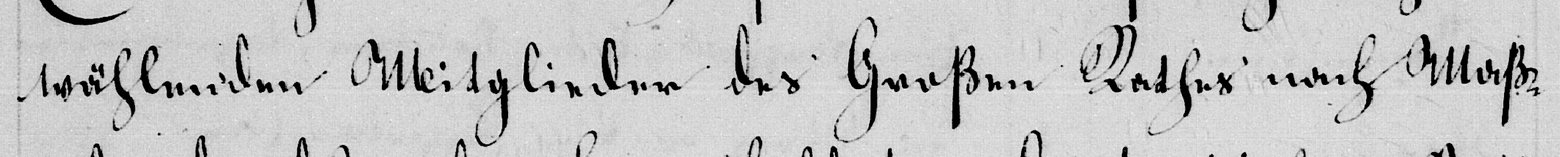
wählenden Mitglieder des Großen Rathes nach Maß¬
